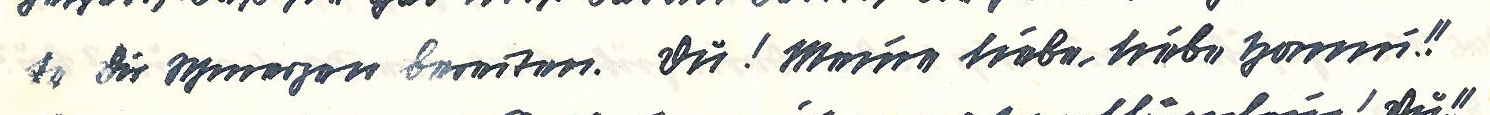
Dir Schmerzen bereiten. Du! Meine liebe, liebe!!
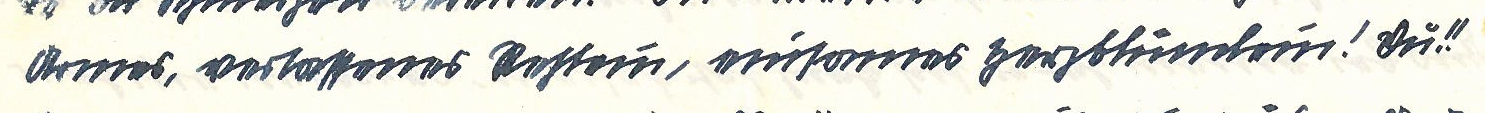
Armes, verlassenes Rehlein, einsames Herzblümlein! Du!!
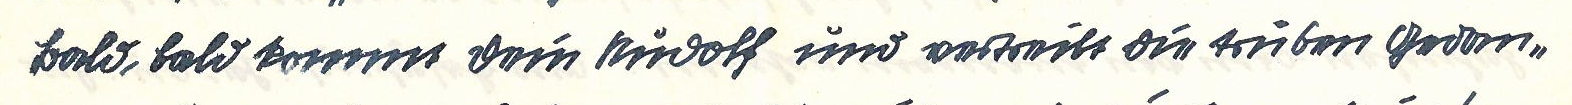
Bald, bald kommt Dein Rudolf und vertreibt die trüben Gedan¬
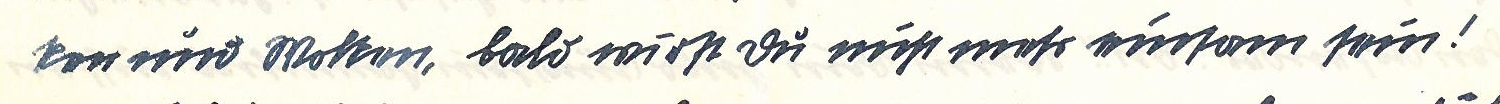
ken und Wolken, bald wirst Du nicht mehr einsam sein!
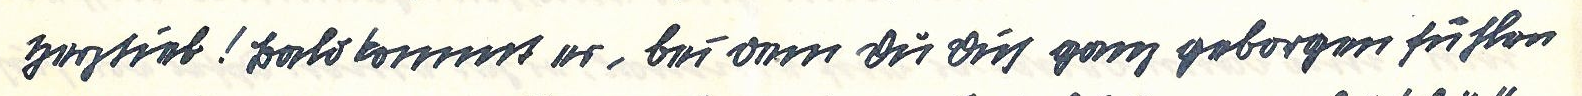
Herzlieb! Bald kommt er, bei dem Du Dich ganz geborgen fühlen
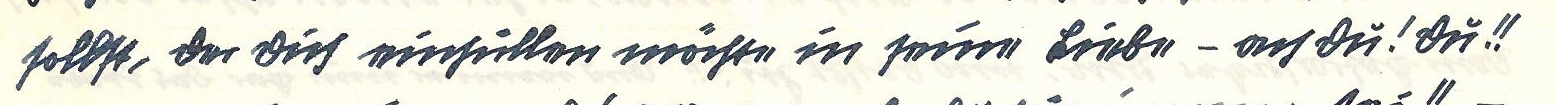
sollst, der Dich einhüllen möchte in seine Liebe – ach Du! Du!!
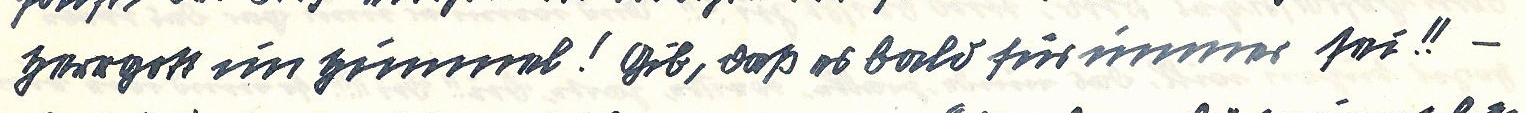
Herrgott im Himmel! Gib, daß es bald für immer sei!! –
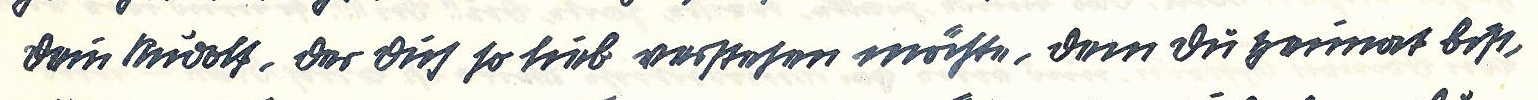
Dein Rudolf, der Dich so lieb verstehen möchte, dem Du Heimat bist,
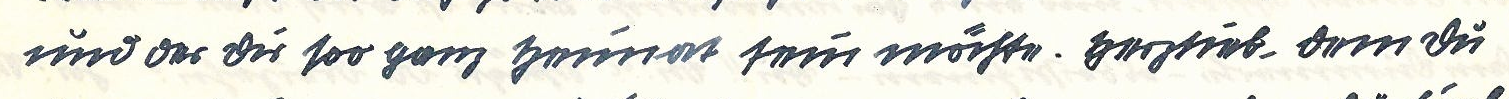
und der Dir soo ganz Heimat sein möchte, Herzlieb, dem Du
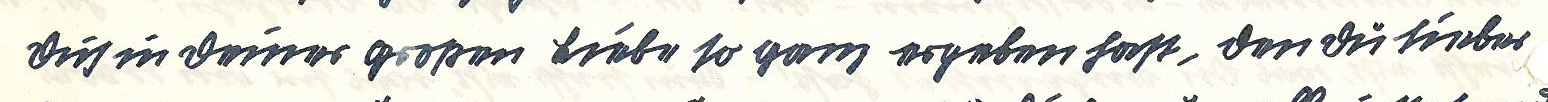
Dich in Deiner großen Liebe so ganz ergeben hast, den Du lieber
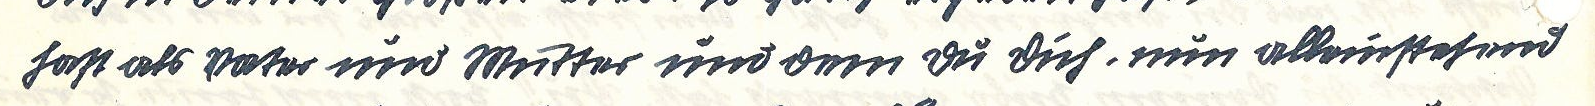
hast als Vater und Mutter und dem Du Dich, nun alleinstehend
